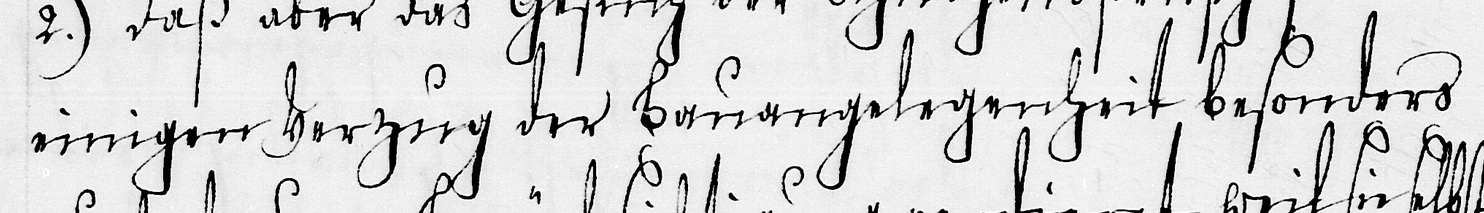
einigen Verzug der Bauangelegenheit besonders
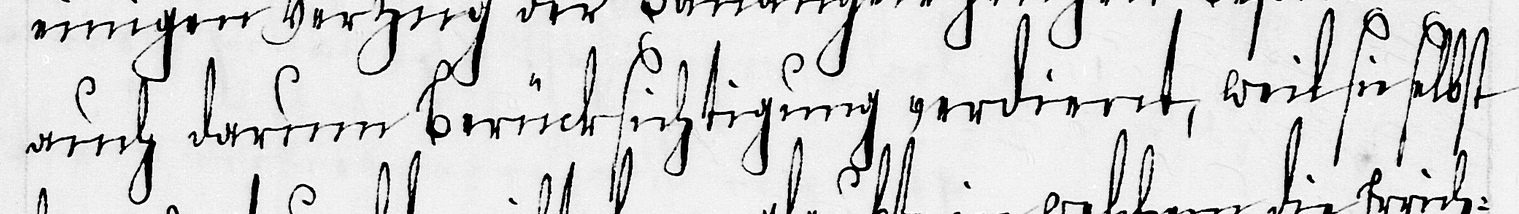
auch darum Berücksichtigung verdient, weil sie sel¬
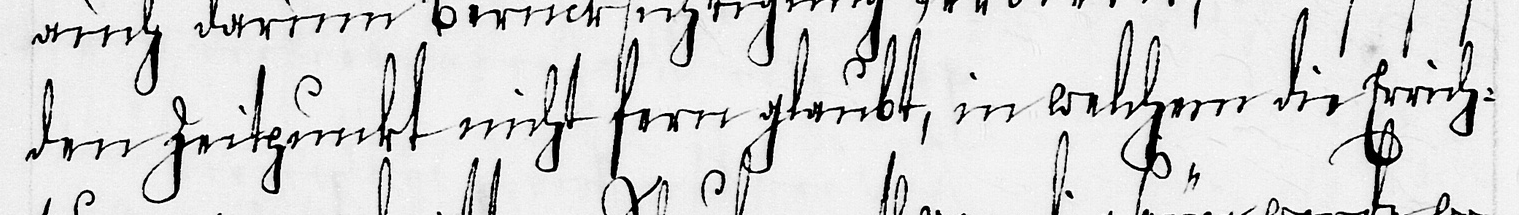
den Zeitpunkt nicht fern glaubt, in welchem die Erri¬
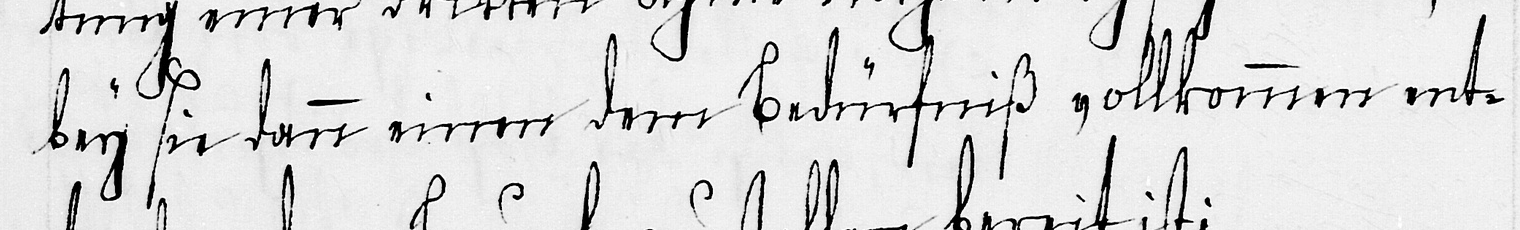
bey sie dann einen dem Bedürfniß vollkommen ent¬
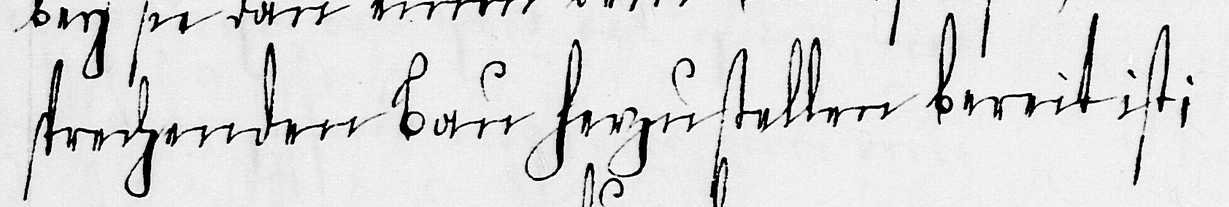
sprechenden Bau herzustellen bereit ist;
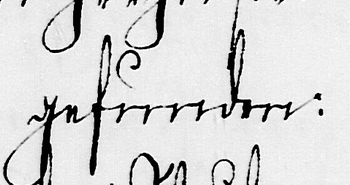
gefunden:
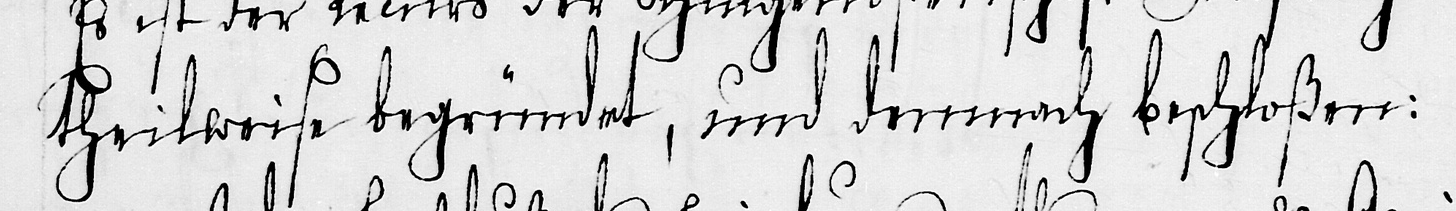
theilweise begründet, und demnach beschloßen:
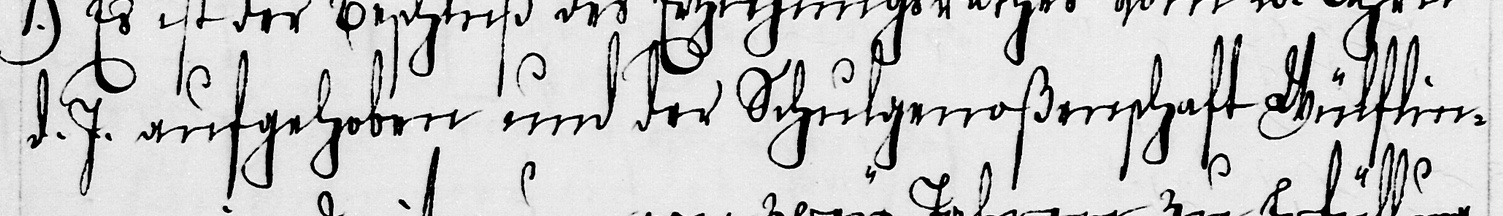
d. J. aufgehoben und der Schulgenoßenschaft Wülflin¬
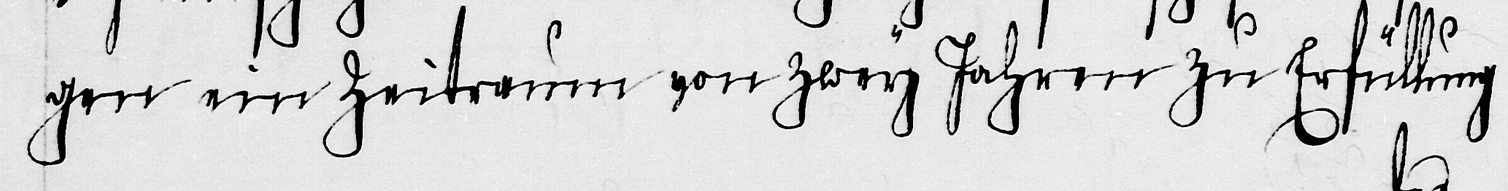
gen ein Zeitraum von zwey Jahren zu Erfüllung
